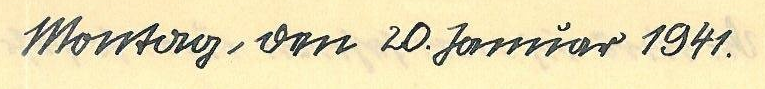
Montag, den 20. Januar 1941.
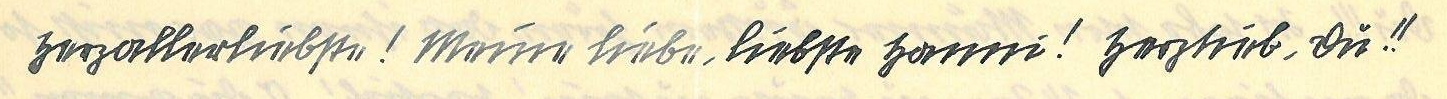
Herzallerliebste! Mein liebe, liebste! Herzlieb, Du!!
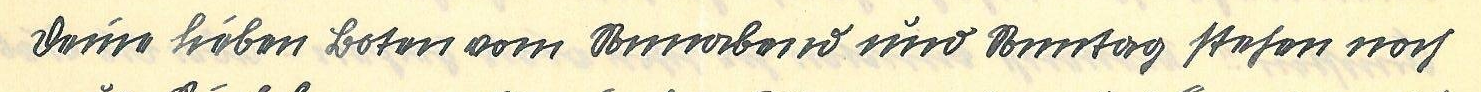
Deine lieben Boten am Sonnabend und Sonntag stehen noch
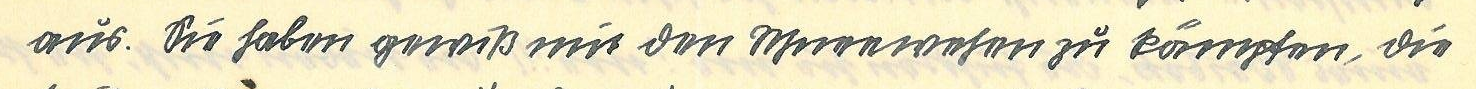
aus. Sie haben gewiß mit den Schneewehen zu kämpfen, die
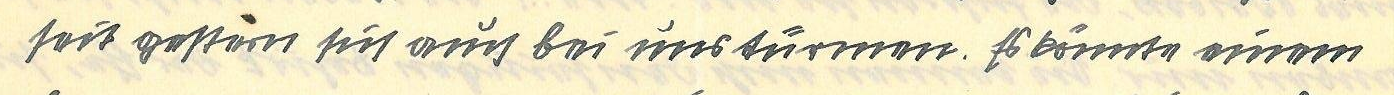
seit gestern sich auch bei uns türmen. Es könnte einem
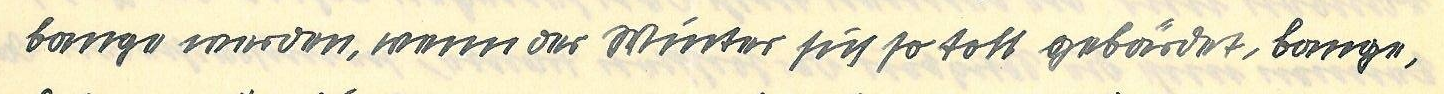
bange werden, wenn der Winter sich so toll gebärdet, bange,
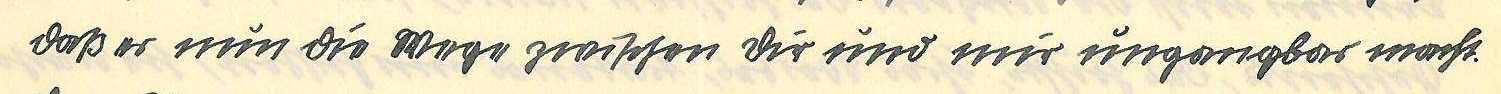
daß er nun die Wege zwischen Dir und mir ungangbar macht.
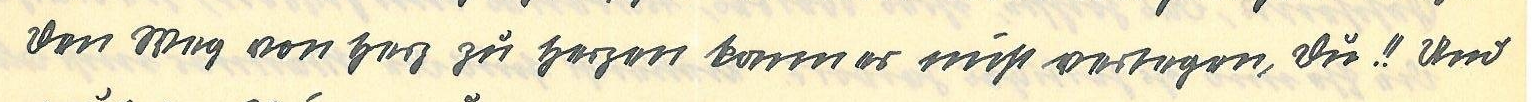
Den Weg von Herz zu Herzen kann er nicht verlegen, Du!! Und
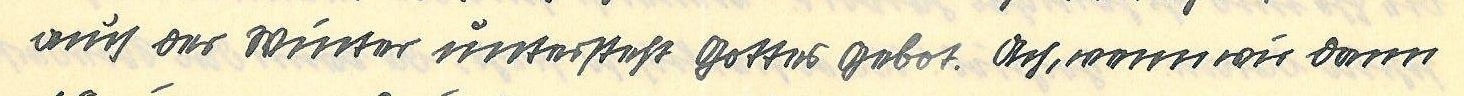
auch der Winter untersteht Gottes Gebot. Ach, wenn wir dann
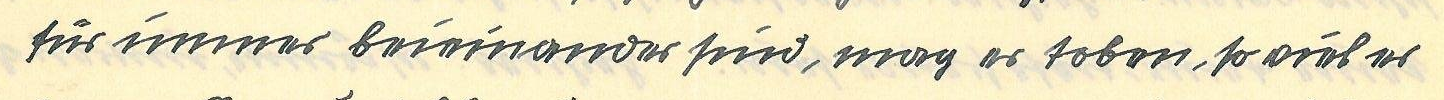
für immer beieinander sind, mag er toben, so viel er
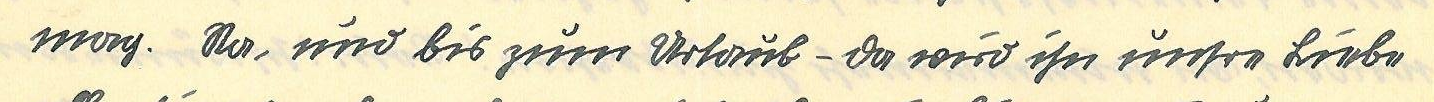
mag. Na, und bis zum Urlaub – da wird ihn unsre Liebe
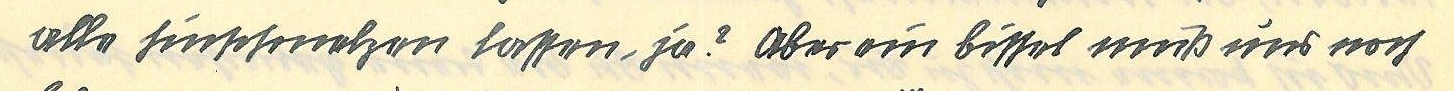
alle hinschmelzen lassen, ja? Aber ein bissel muß uns noch
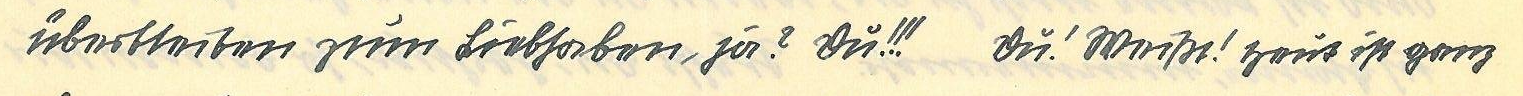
überbleiben zum Liebhaben, ja? Du!!! Du! Weißt! Heut ist ganz
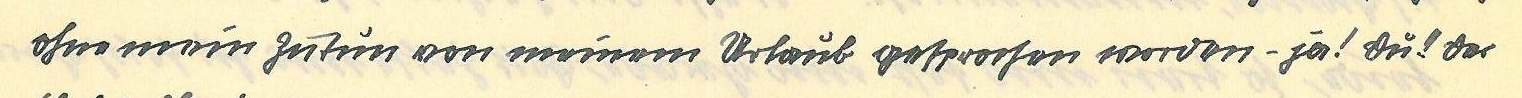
ohne mein Zutun von meinem Urlaub gesprochen worden – ja! Du! Der
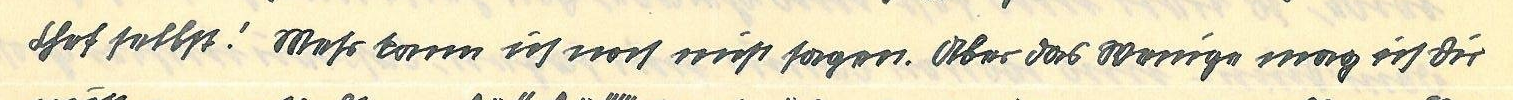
Chef selbst! Mehr kann ich noch nicht sagen. Aber das Wenige mag ich Dir
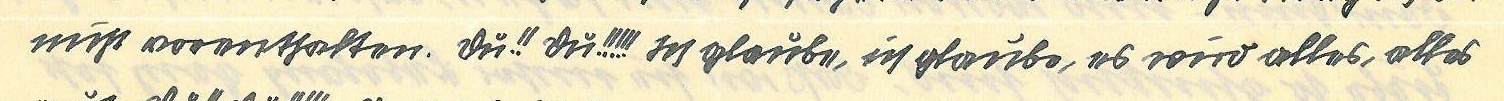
nicht vorenthalten. Du!! Du!!!!! Ich glaube, ich glaube, es wird alles, alles
